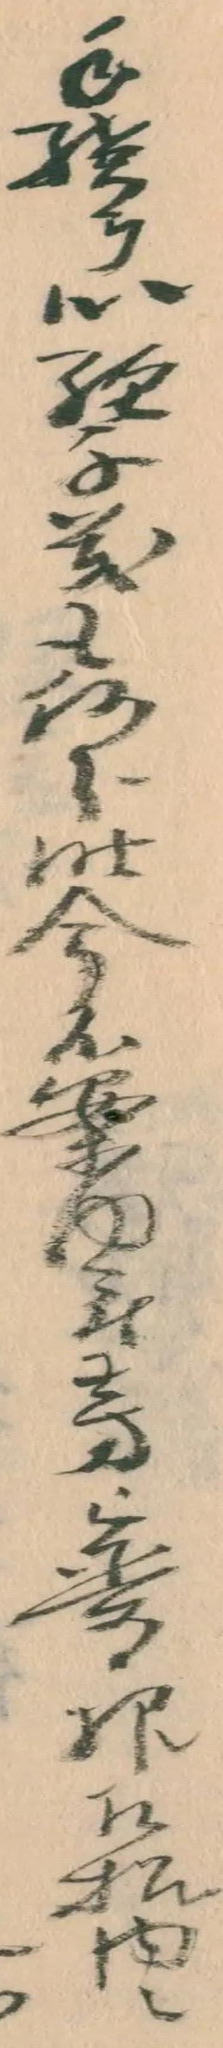手続ヲ以経千義も何分昨今不案内ニ付旁被参候様被招内々
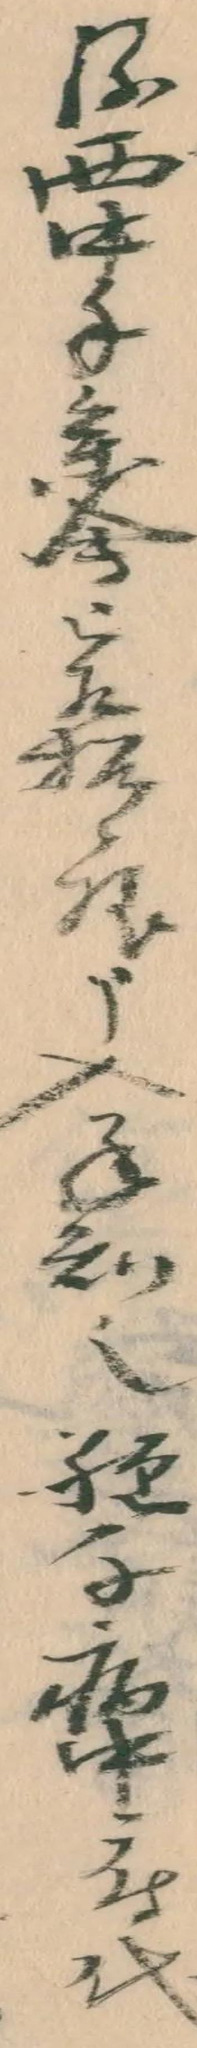後西中手参會被相招候様申入承知也経千病中に付代
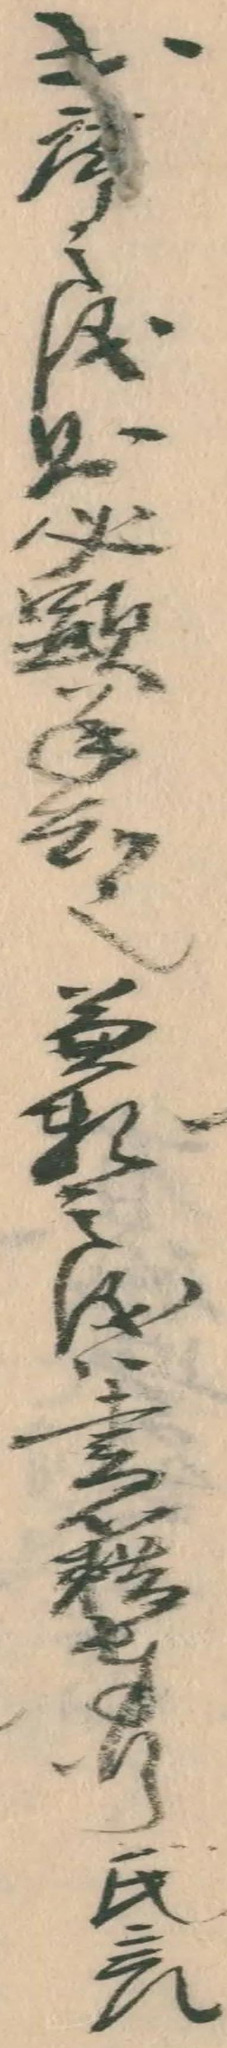出席之儀則必顕年知也兼頼之儀は書籍奉行民彦
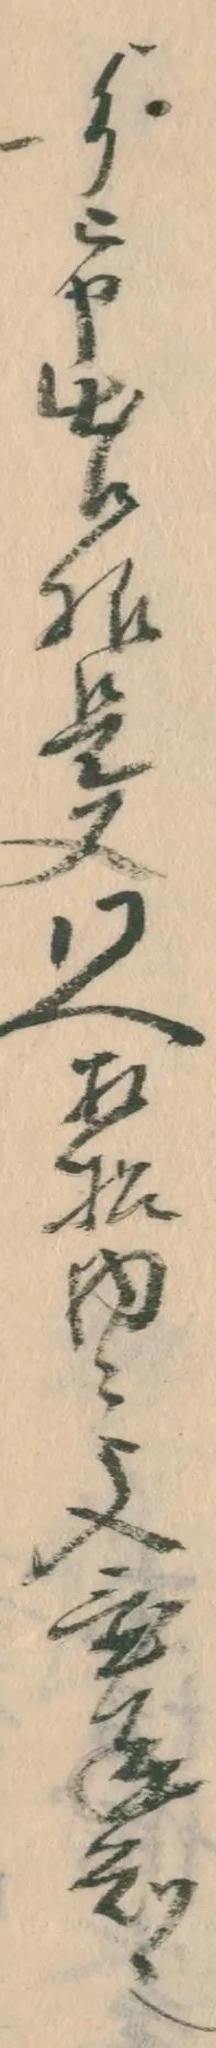より被申出候様是又同人相招内々申入置承知也
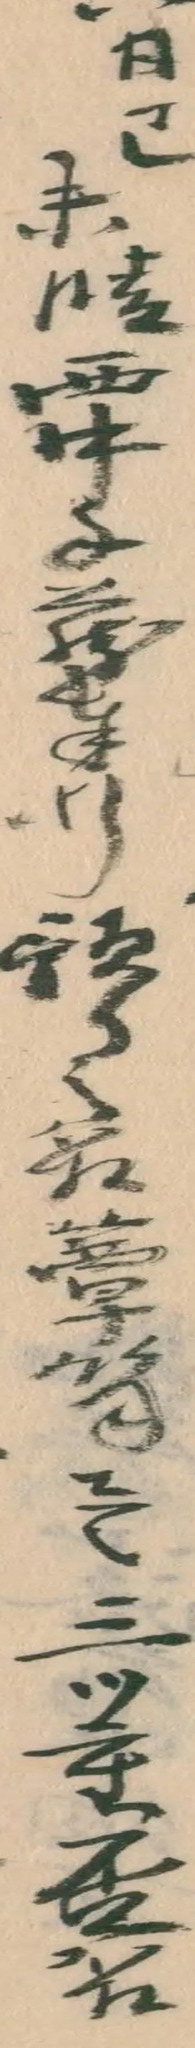六日己未晴西中手蔵奉行預り之箱箪笥壱三ツ重盃箱
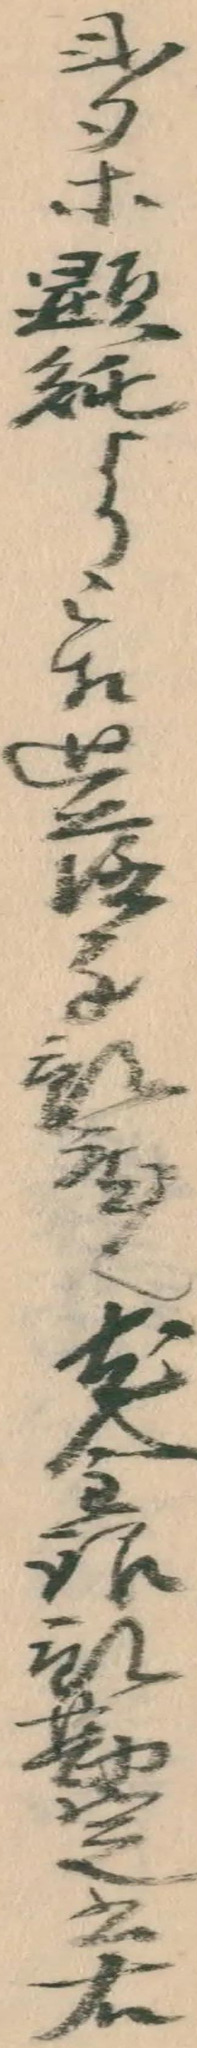弐ツ等顕純より被相廻落手預置也尤金銀預勘定書右
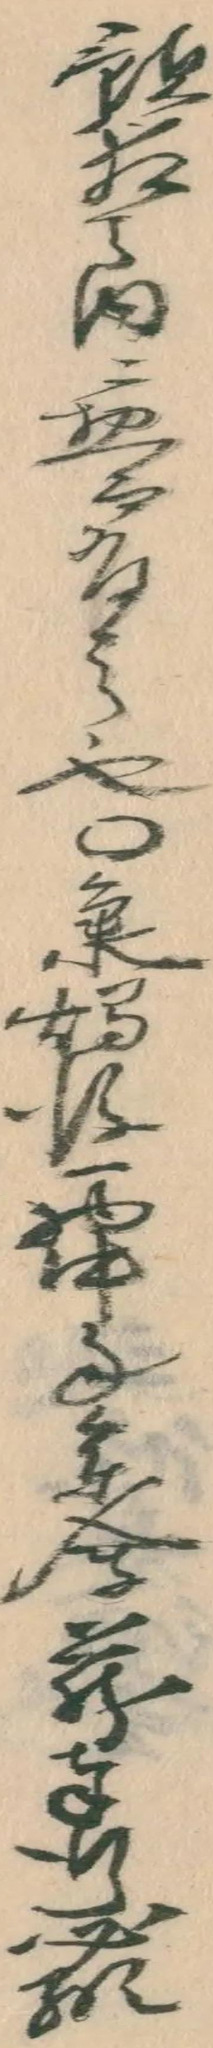預箱之内ニ惣而有之也○秉燭後西中手参會蔵奉行必顕
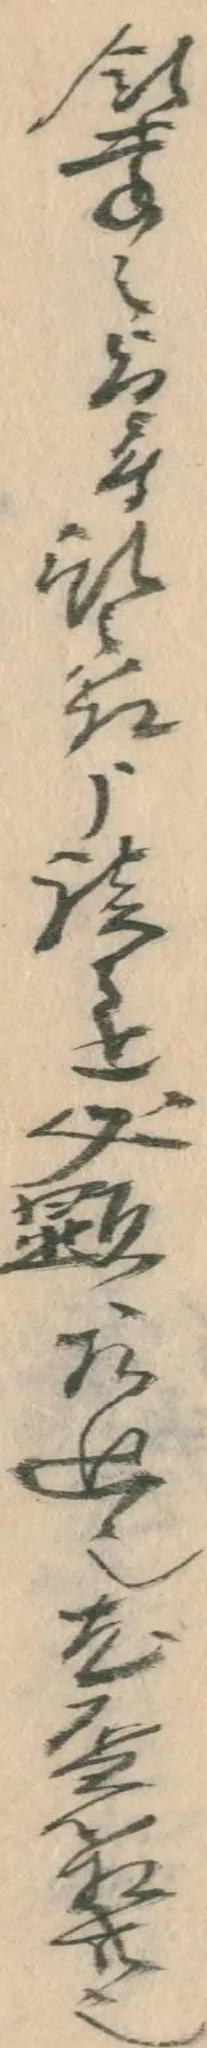領掌之旨ニ付預箱申談之上必顕へ相廻也尤盃箱共也
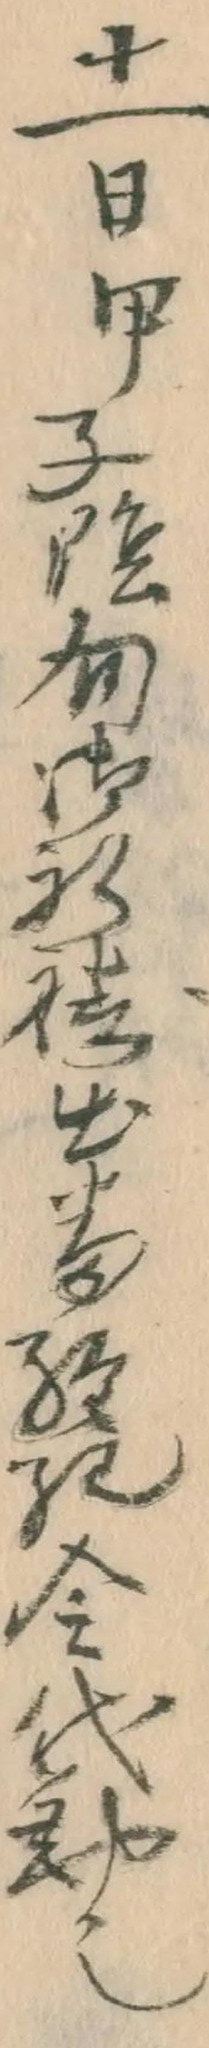十一日甲子陰旬御祈祷出番経紀令代勤也
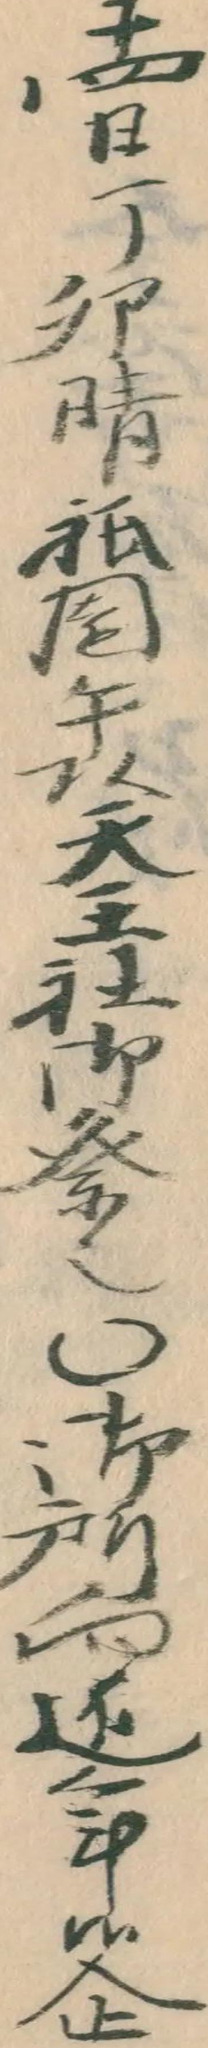十四日丁卯晴祇園午頭天王社御祭也○御所向近年御企
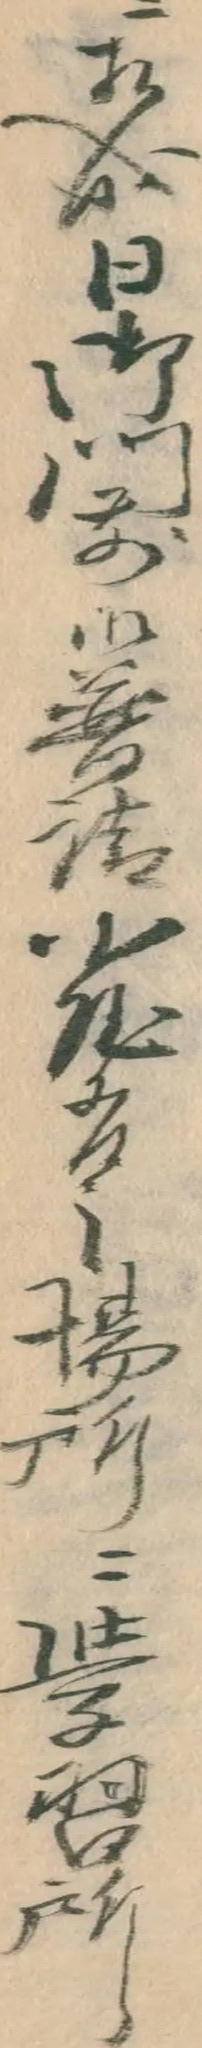二相成日御門前御普請小屋有之場所ニ學習所

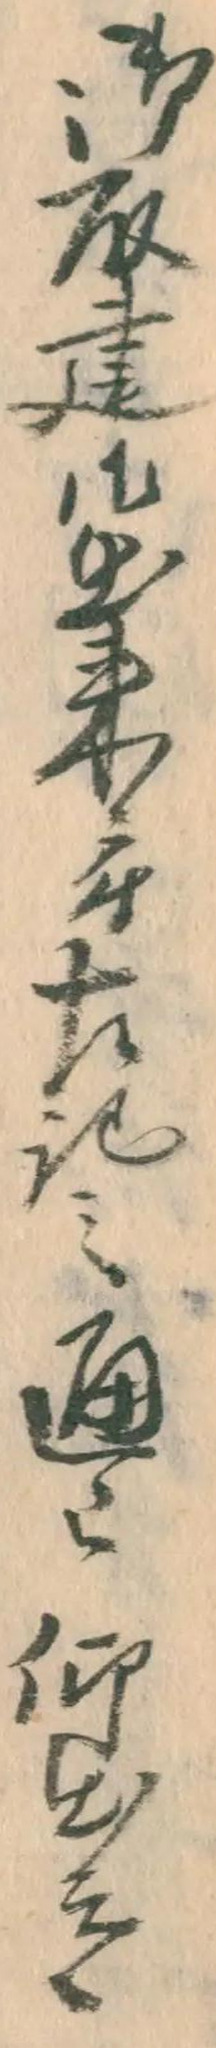御取建御出来ニ付左記之通被仰出云々
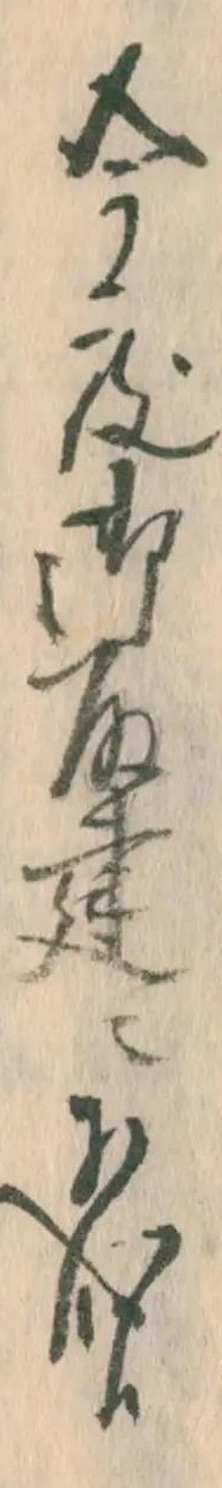今度御取建ニ相成候
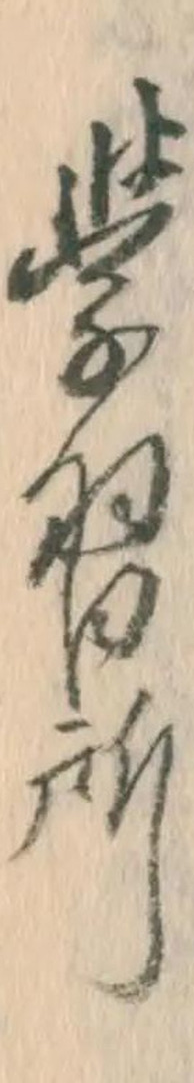學習所
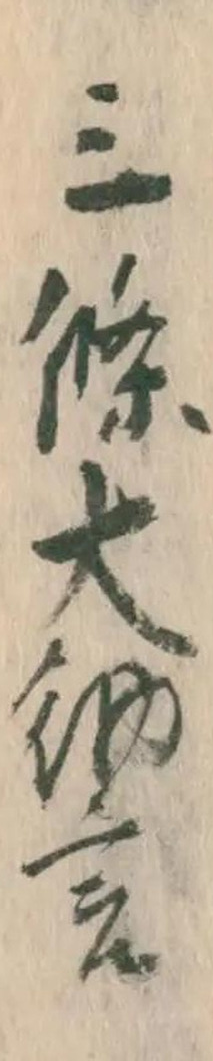三條大納言
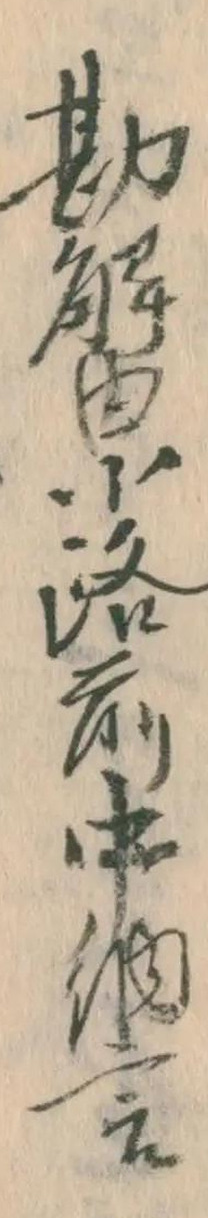勘解由小路前中納言
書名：賀茂社記録. 第70冊
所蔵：国立国会図書館 National Diet Library, JAPAN
